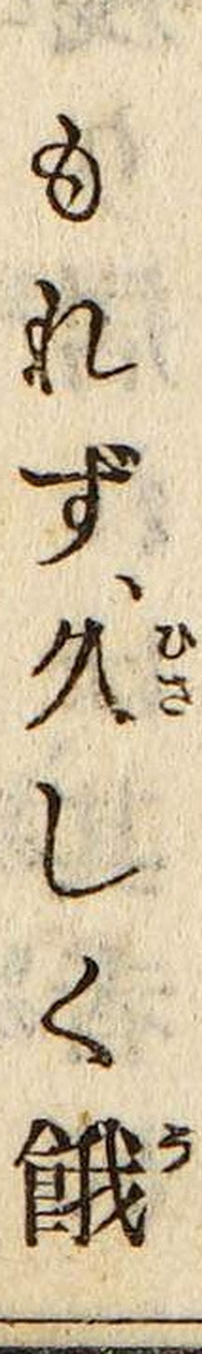もれず、久しく餓
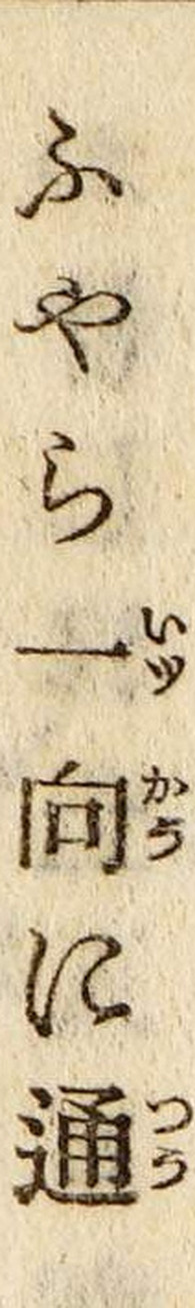ふやら一向に通
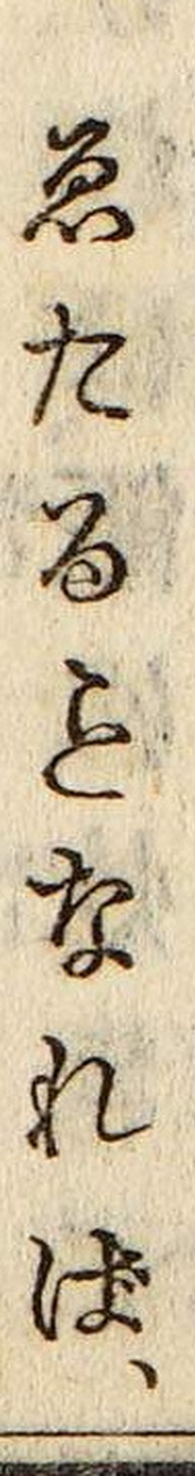ゑたることなれば、
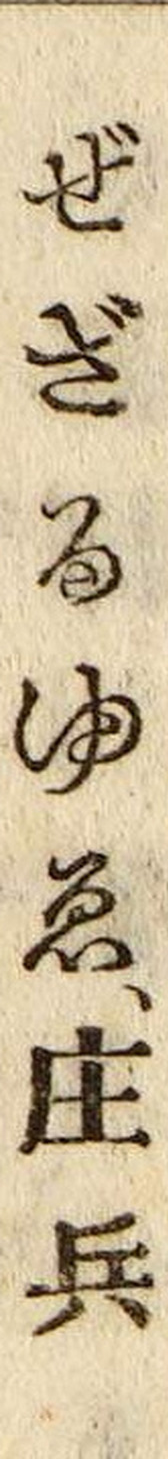ぜざるゆゑ、庄兵
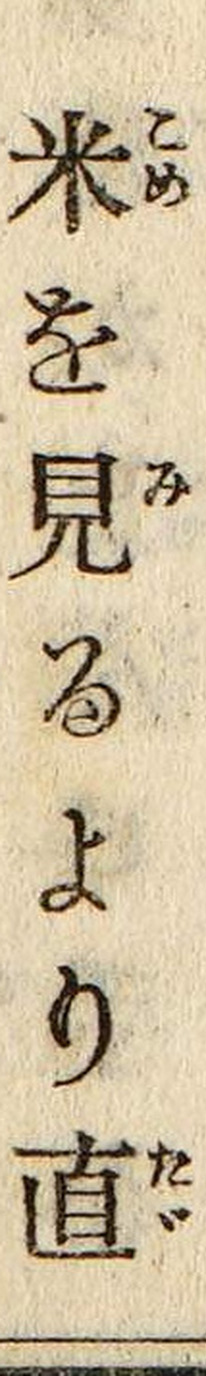米を見るより直

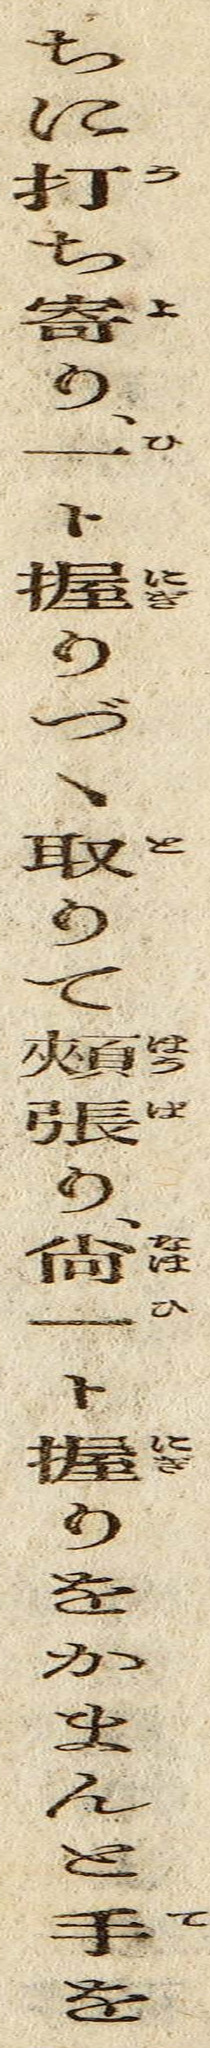ちに打ち寄り、一ト握りづヽ取りて頬張り、尚一ト握りをかまんと手を
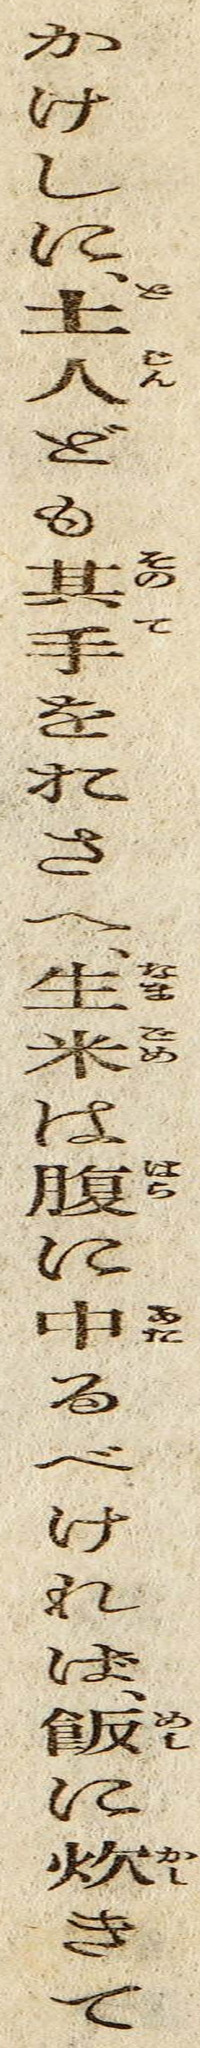かけしに、土人ども其手をおさへ、生米は腹に中るべければ、飯に炊きて
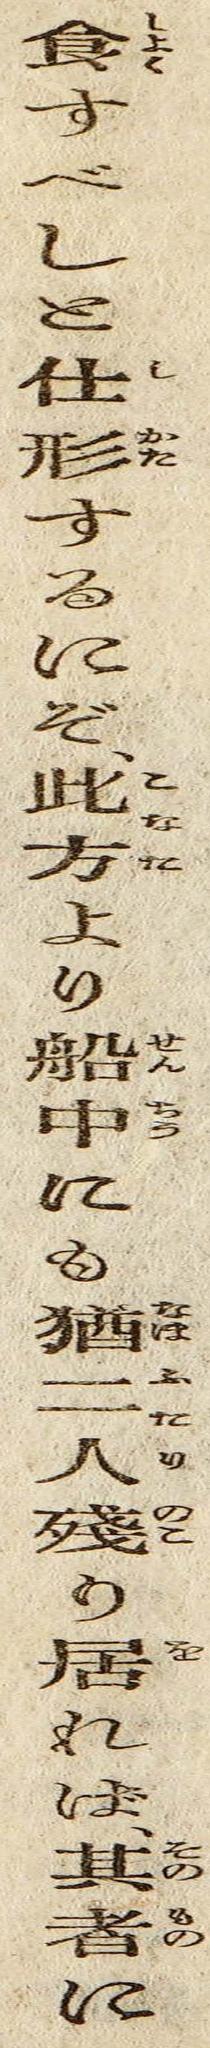食すべしと仕形するにぞ、此方より船中にも猶二人残り居れば、其者に
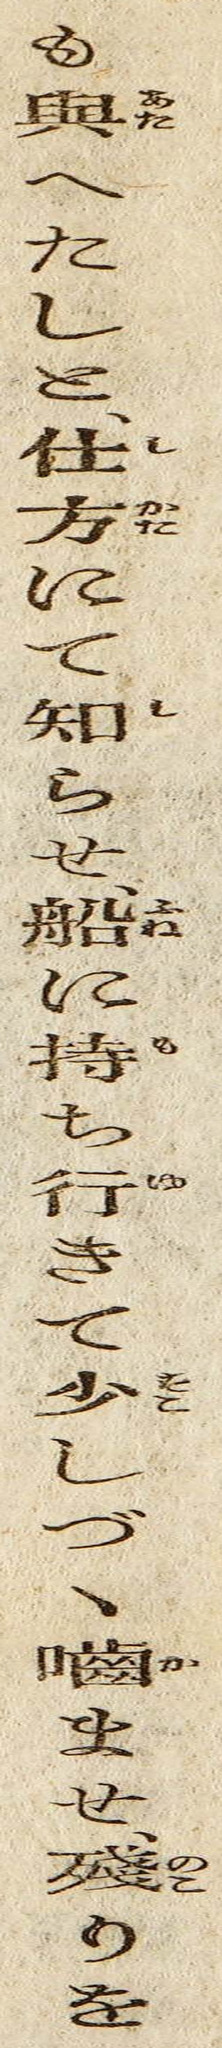も与へたしと、仕方にて知らせ、船に持ち行きて少しづヽ噛ませ、残りを
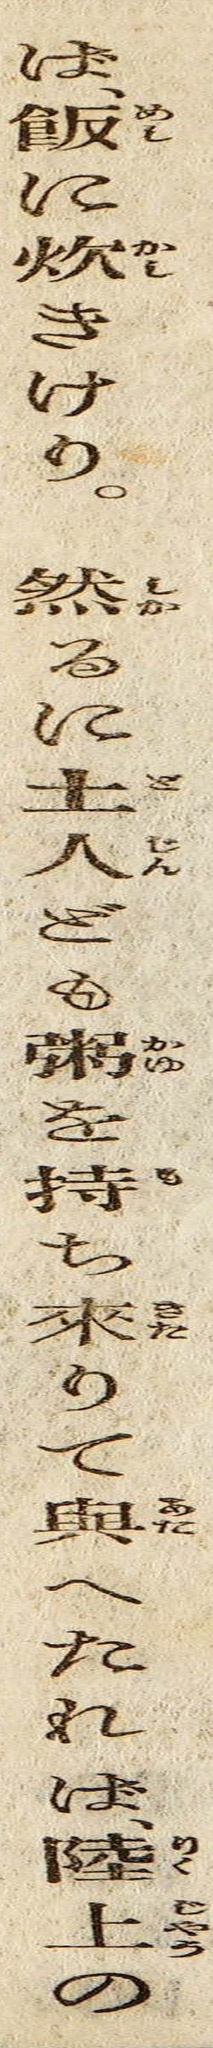ば、飯に炊きけり。然るに土人ども粥を持ち来りて与へたれば、陸上の
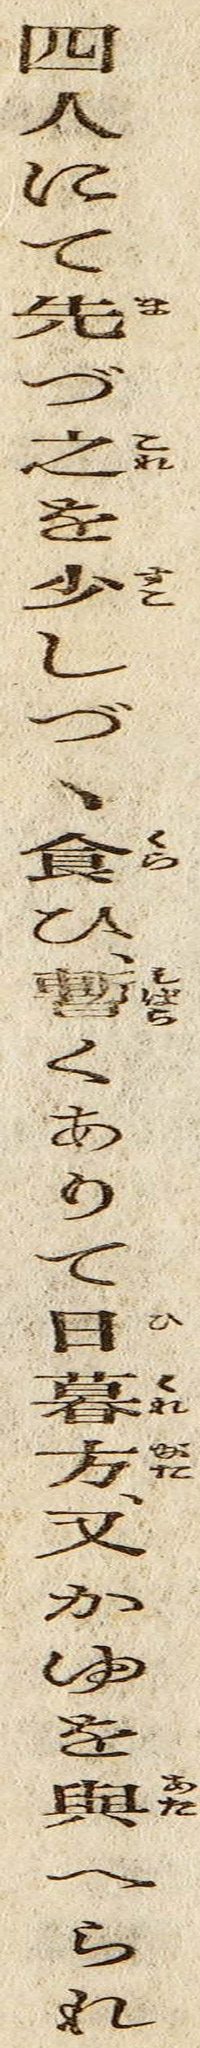四人にて先づ之を少しづヽ食ひ、暫くありて日暮方、又かゆを与へられ
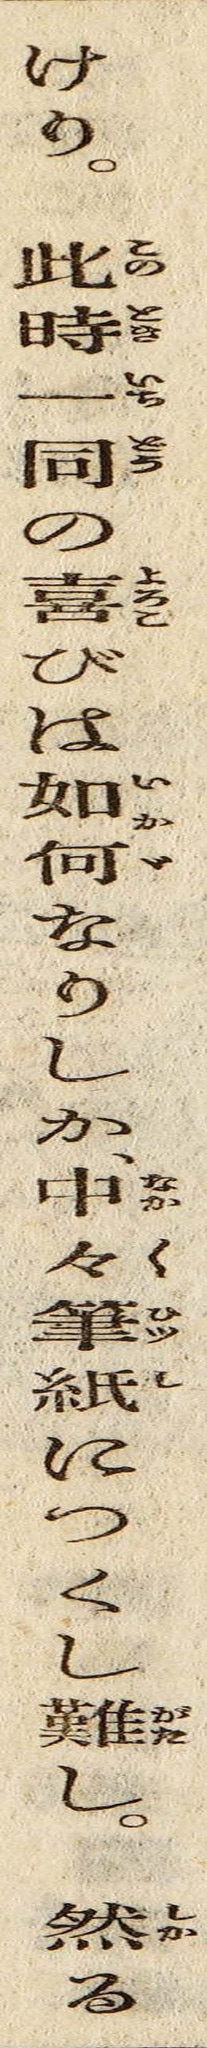けり。此時一同の喜びは如何なりしか、中々筆紙につくし難し。然る
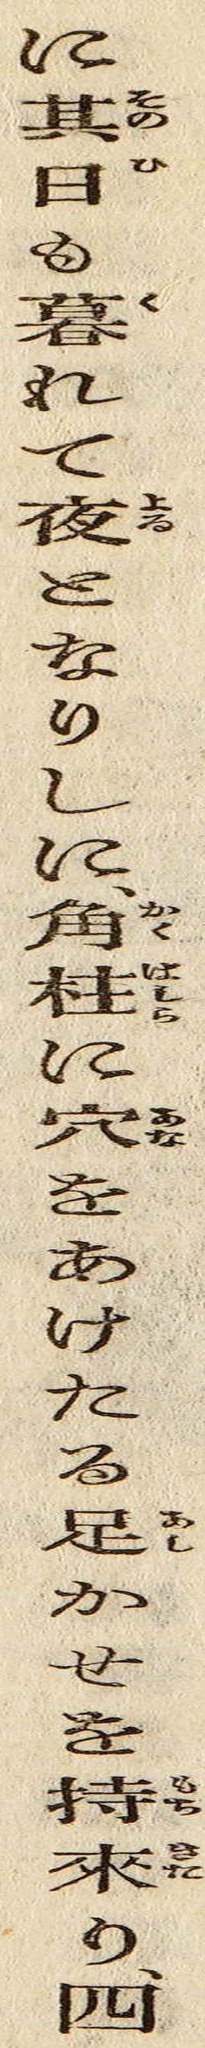に其日も暮れて夜となりしに、角柱に穴にあけたる足かせを持来り、四
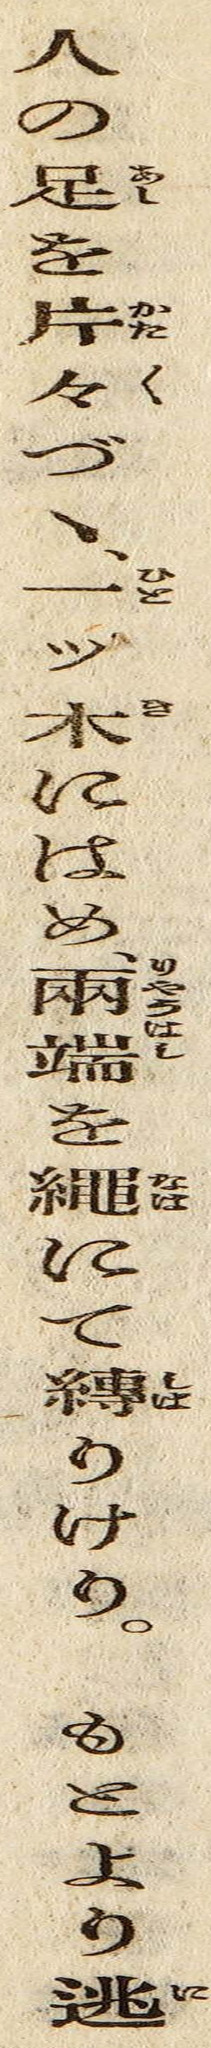人の足を片々づヽ、一ツ木にはめ、両端を縄にて縛りけり。もとより逃
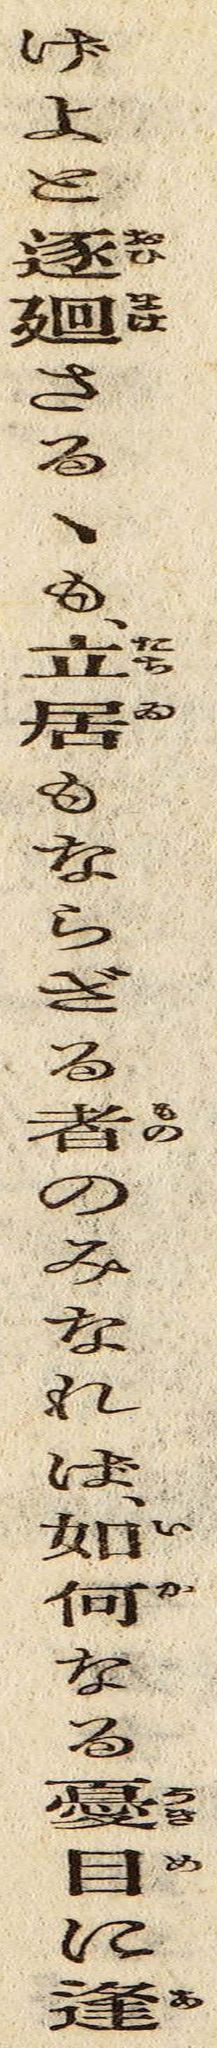げよと逐廻さるヽも、立居もならざる者のみなれば、如何なる憂目に逢
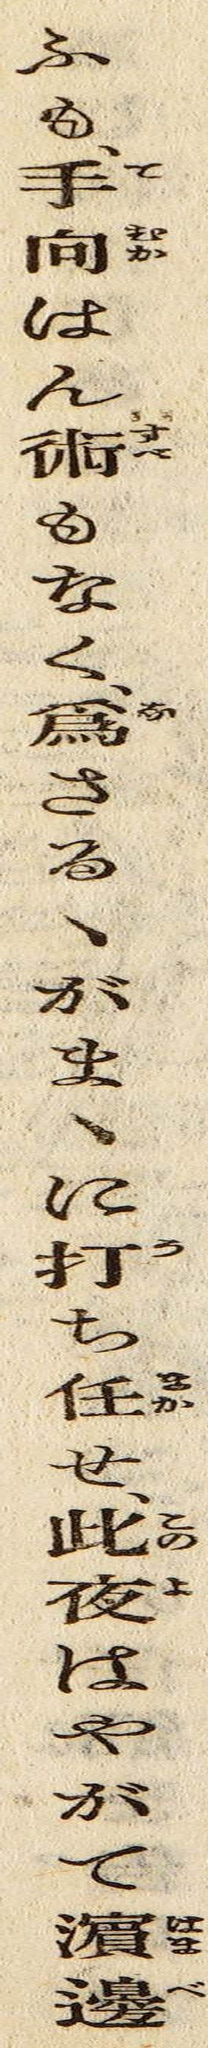ふも、手向はん術もなく、為さるヽがまヽに打ち任せ、此夜はやがて浜辺
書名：日本漂流譚
